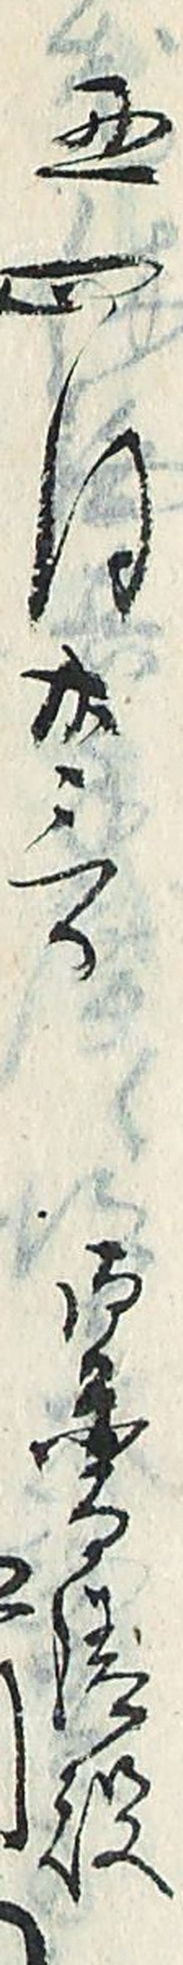丑四月廿三日御普請役
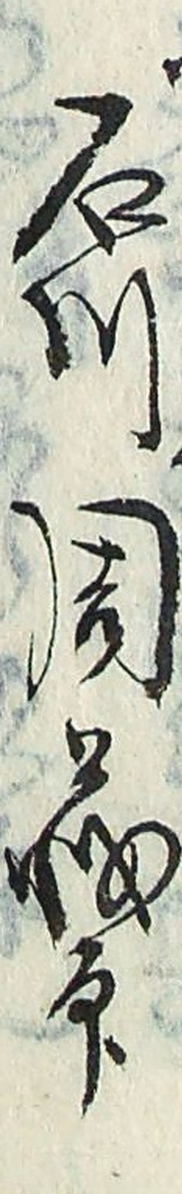石川周蔵印
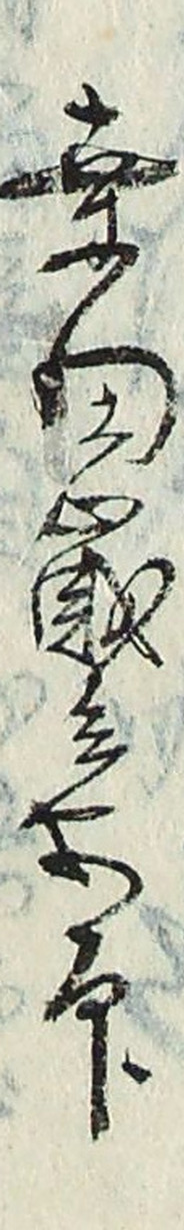桑田歳兵衛印
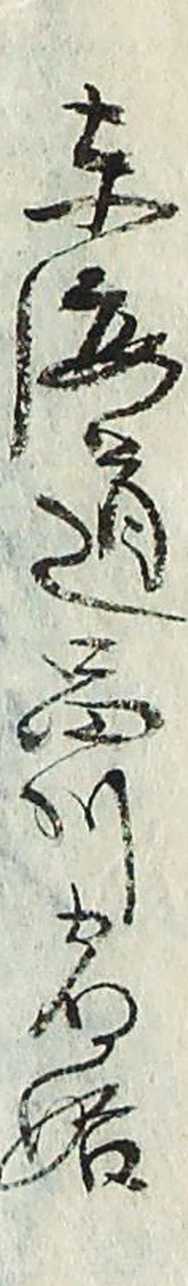東海道品川宿始
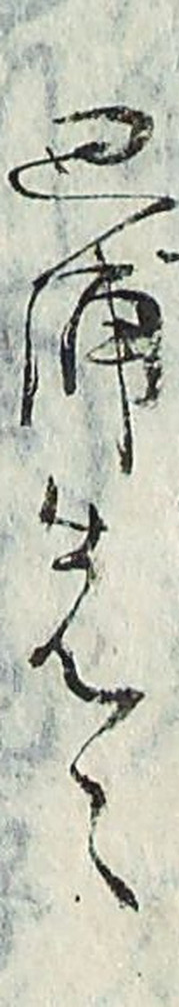廻浦先々
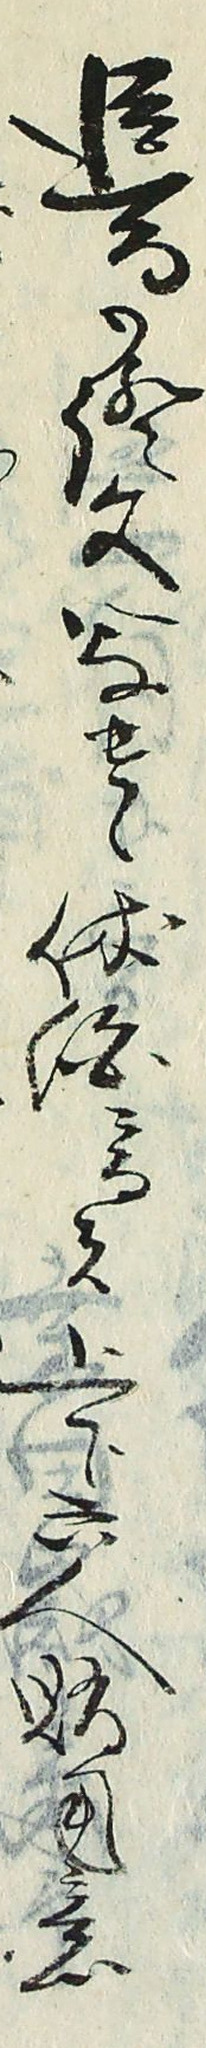追て御証文写遣候休泊にては上下六人賄用意
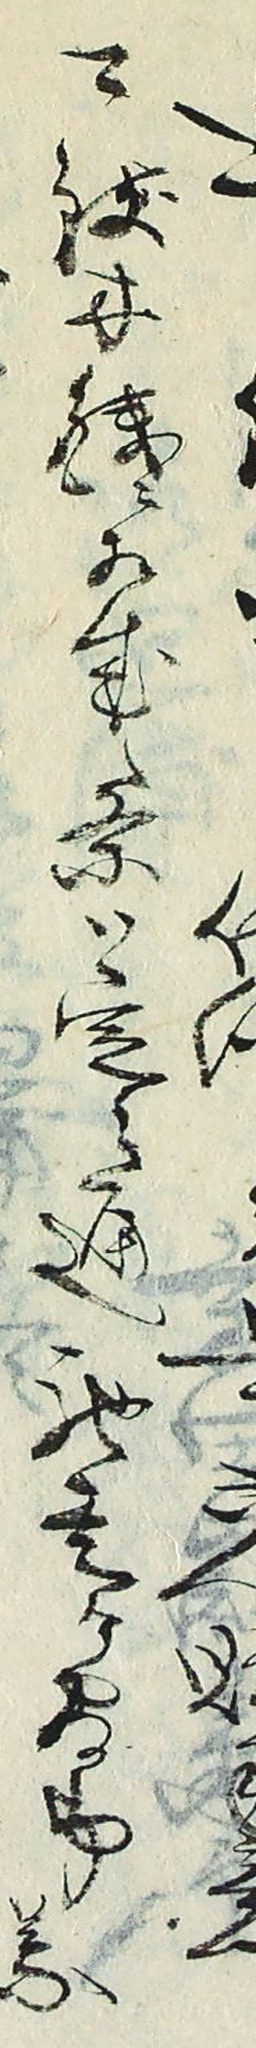可致木錢に相成候条御定之通馳走ヶ間布義
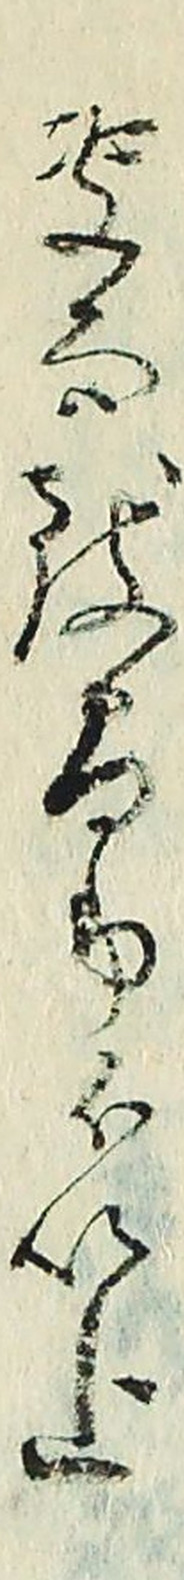決て致間布候以上
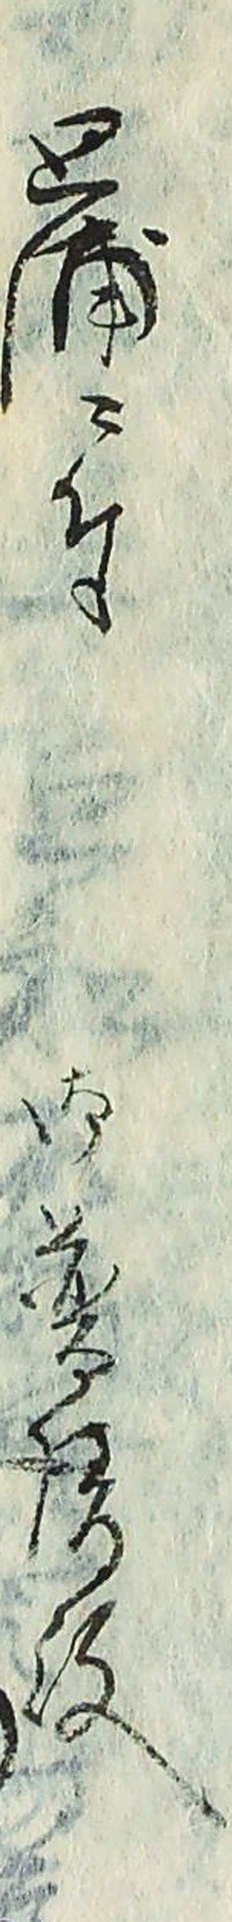廻浦に付御普請役
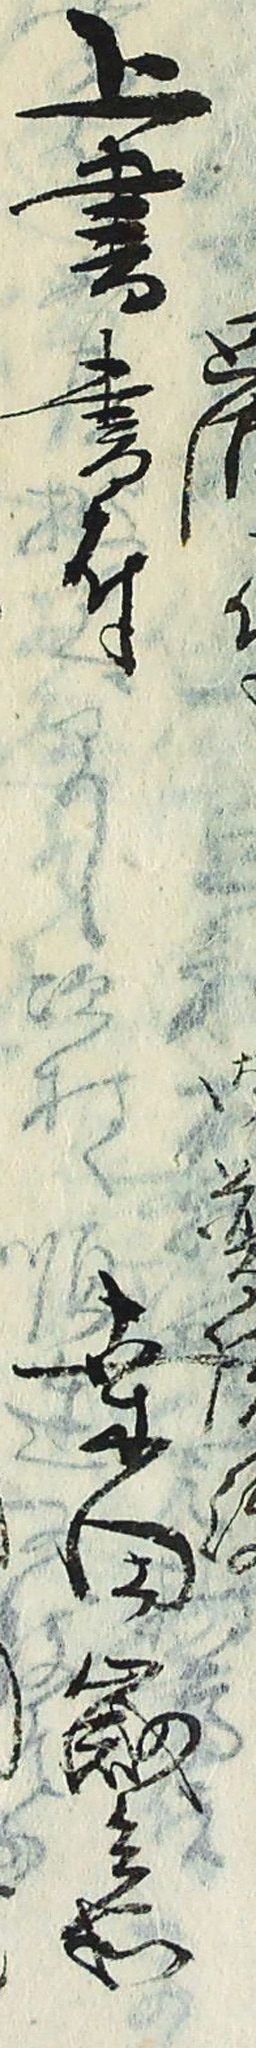上書書付桑田歳兵衛
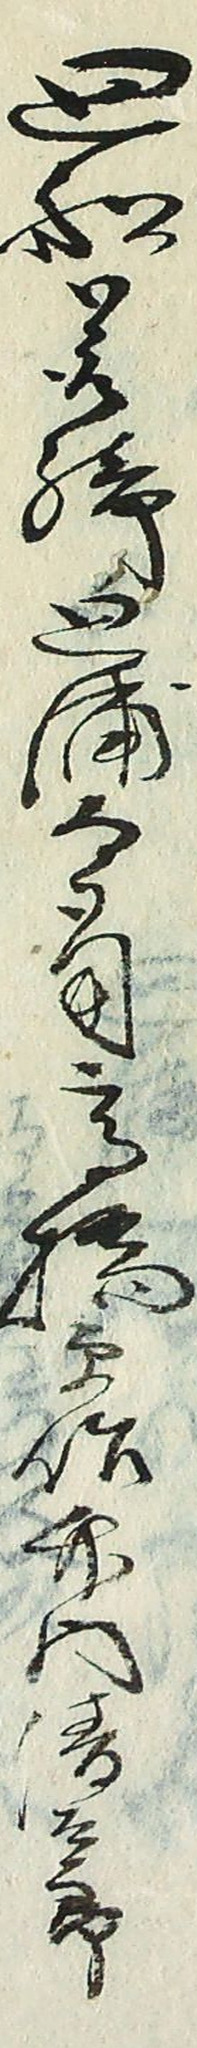廻船御取締廻浦為御用高橋平作竹内清太郎
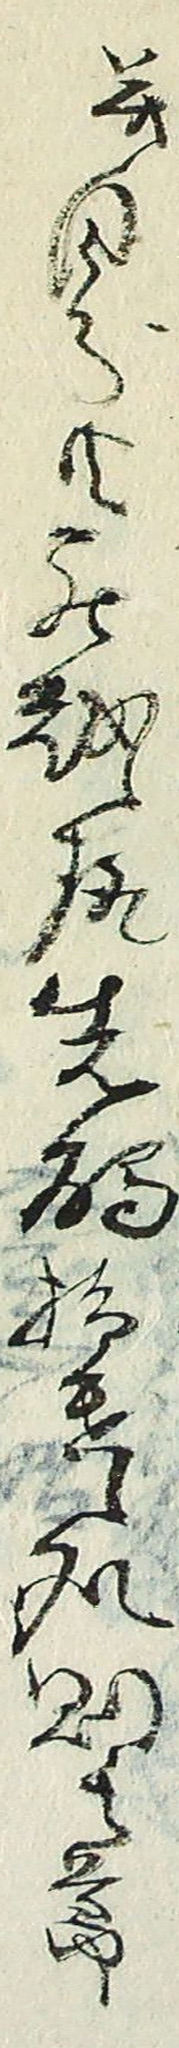并自分共罷越候趣先触指遣し候処則其節
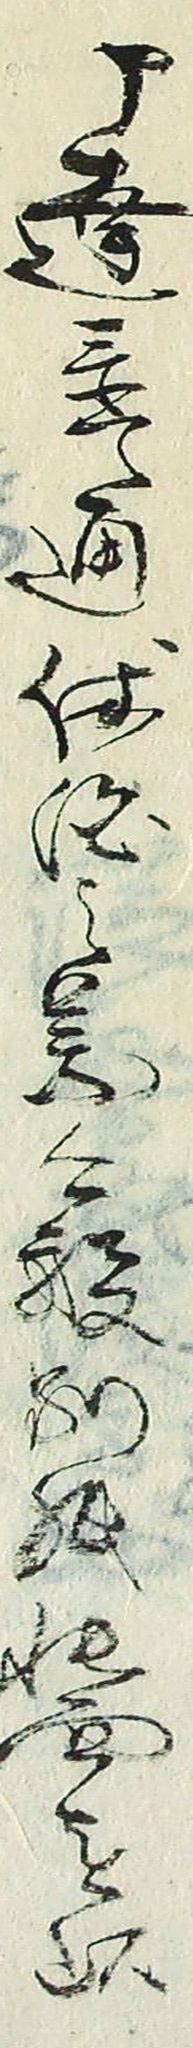申達置候通休泊之義今般別紙帳面を以
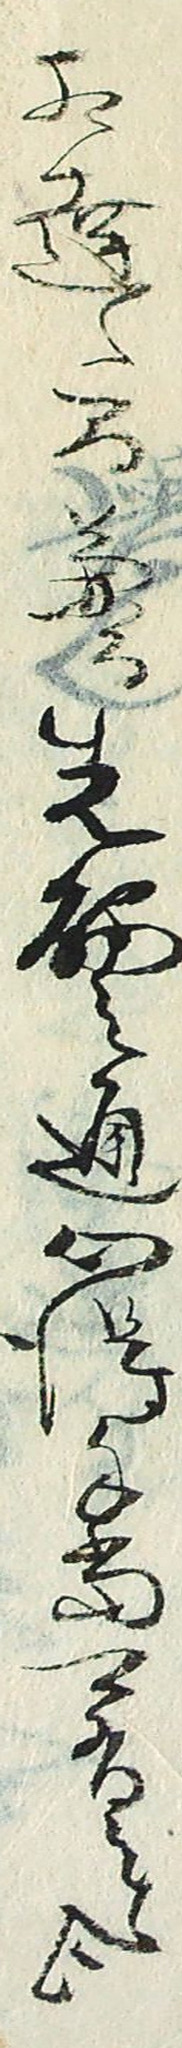相達候間兼て先触之通心得手当可有之候以上
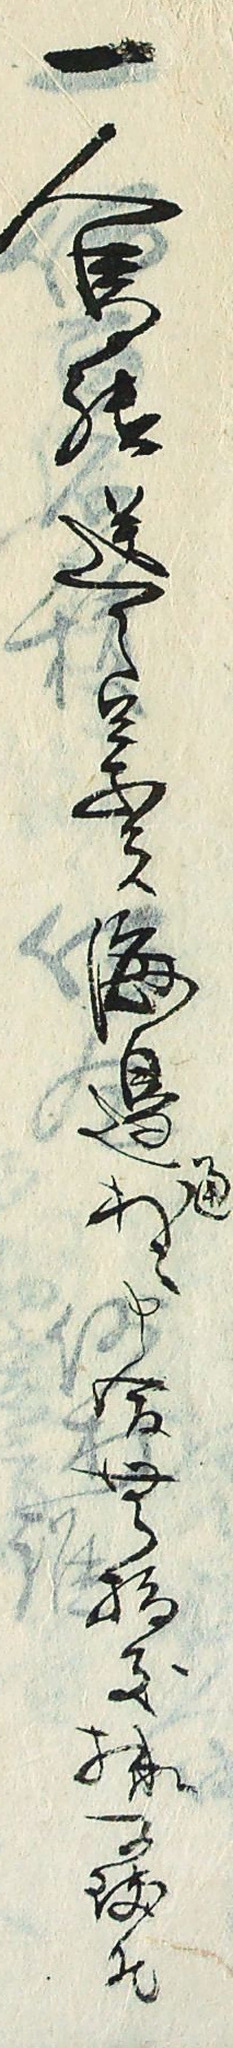一人馬継送之義は海辺通村々申合無指支様可致候
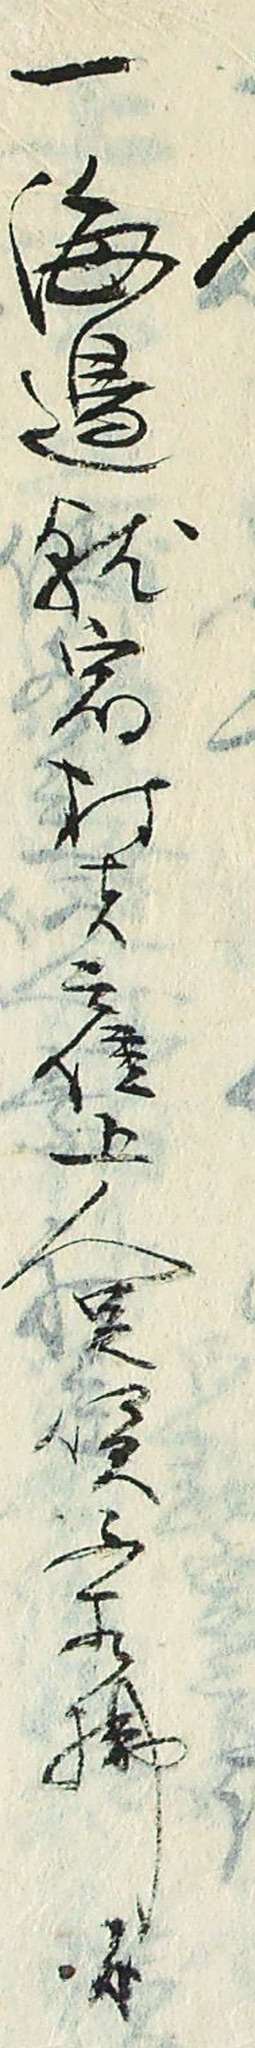一海辺就宿村は雇上人足賃不相払候
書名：公辺御役人為御廻浦御立越諸御用一巻
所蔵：鳴門教育大学 Naruto University of Education
